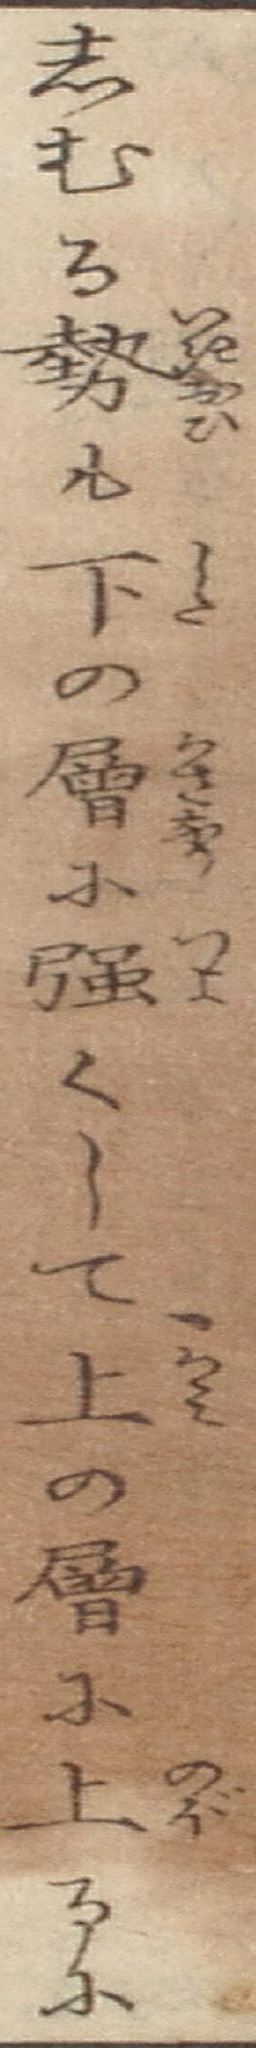しむる勢も下の層に強くして、上の層に上るに
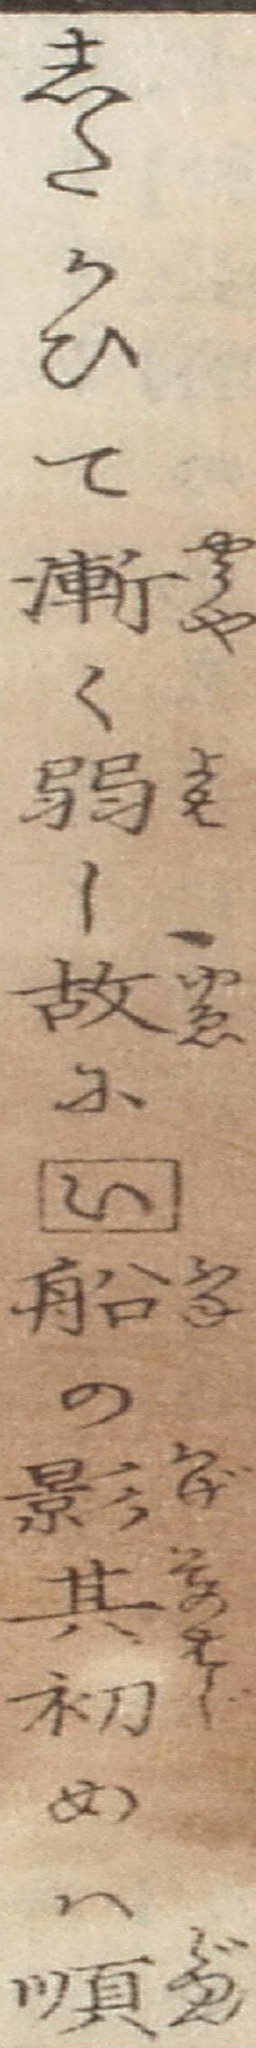したかひて漸く弱し、故にい船の影其初めは順
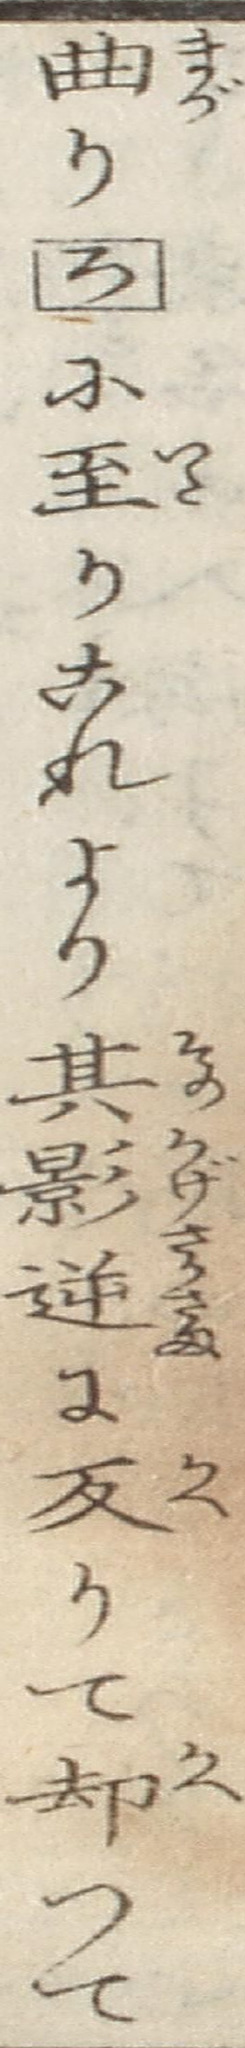曲りろに至りこれより其影逆に反りて却つて
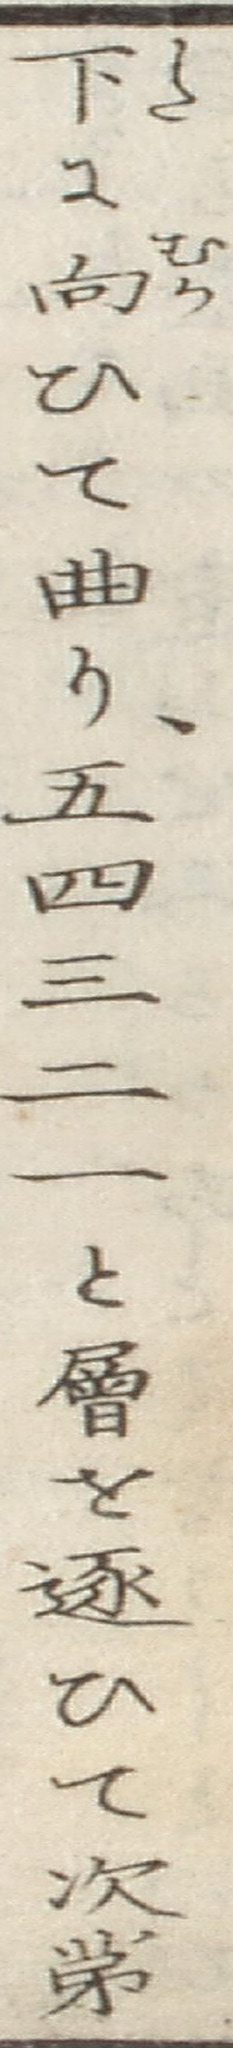下に向ひて曲り、五四三二一と層を逐ひて次第
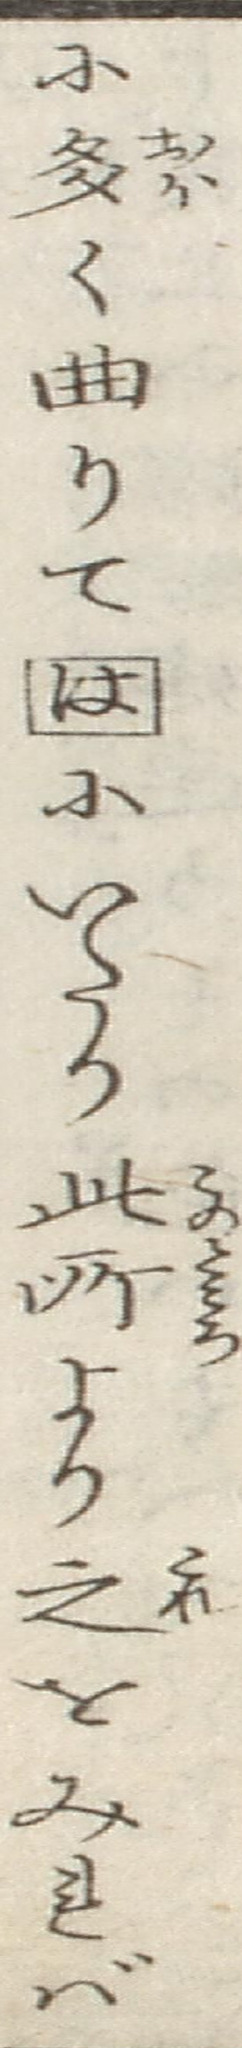に多く曲りてはにいたり此所より之をみれば
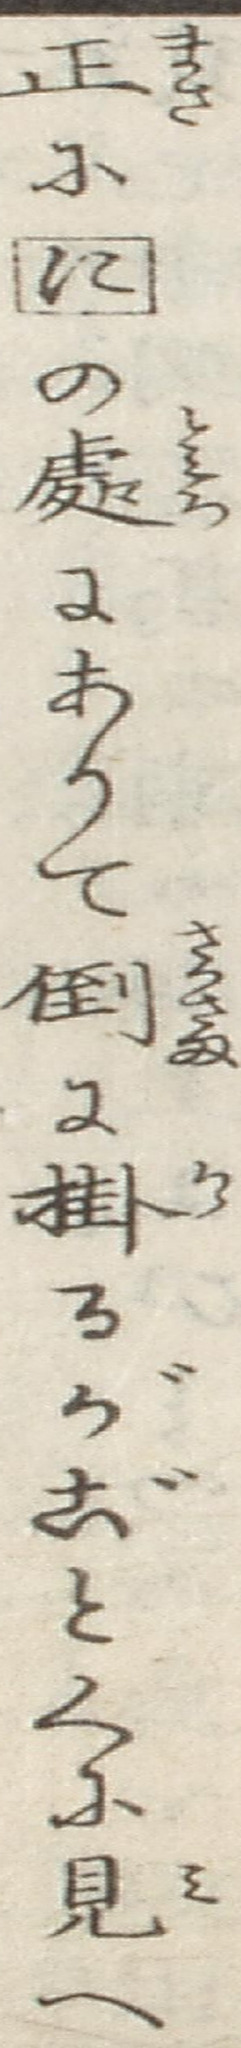正ににの処にありて倒に掛るがごとくに見へ
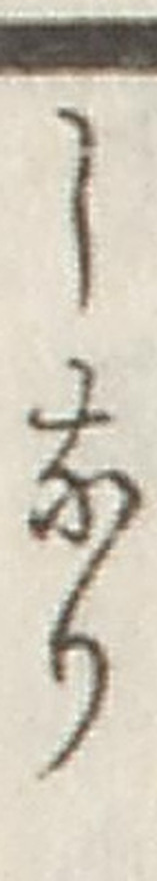しなり
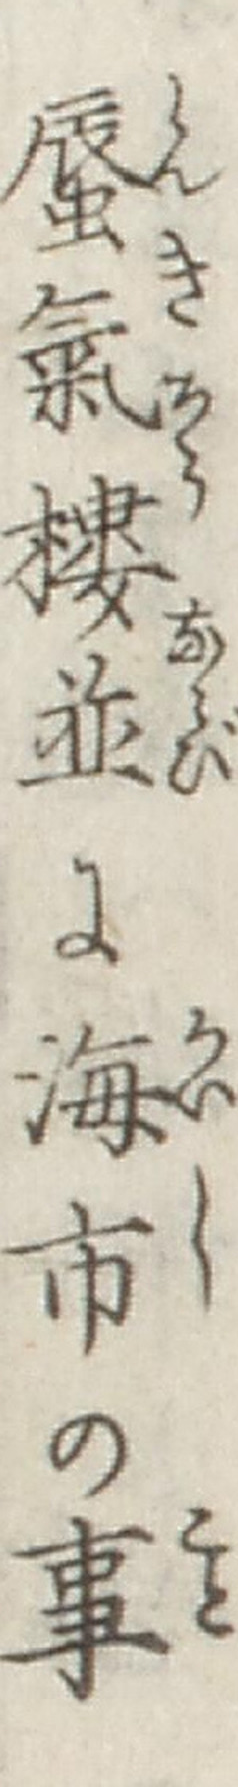蜃気楼並に海市の事

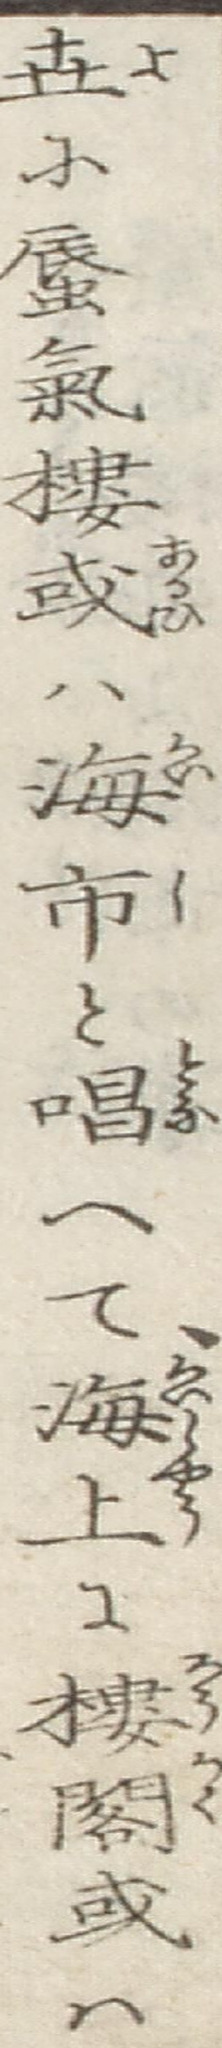世に蜃気楼或は海市と唱へて、海上に楼閣或は
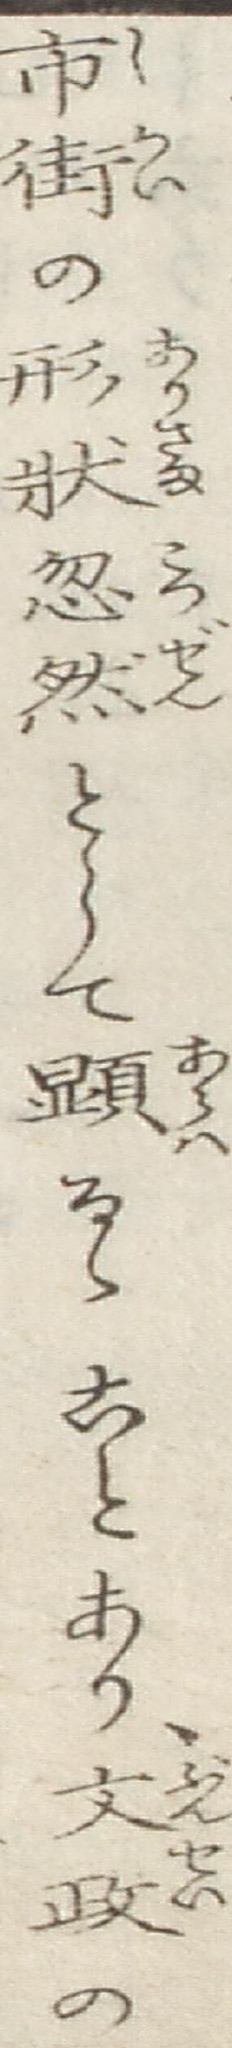市街の形状忽然として顕るゝことあり、文政の
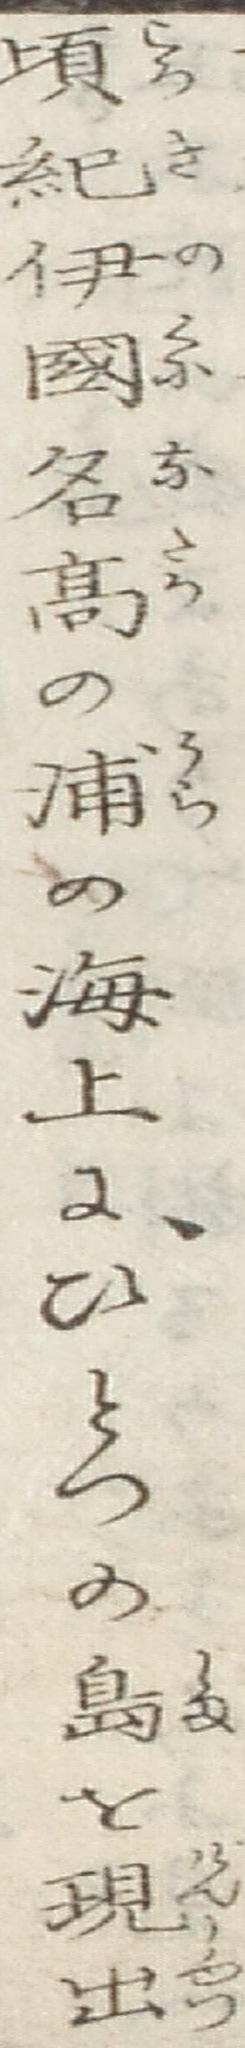頃紀伊国名高の浦の海上に、ひとつの島を現出
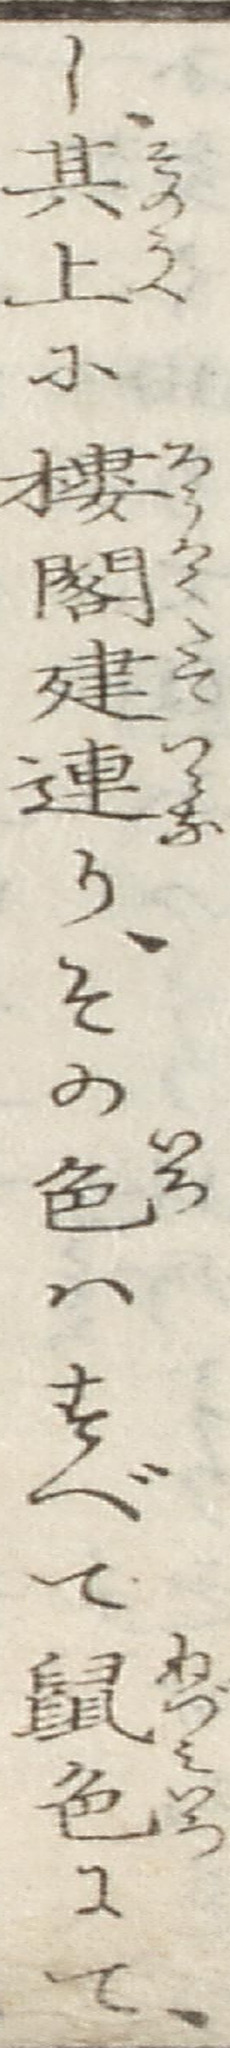し、其上に楼閣建連り、その色はすべて鼠色にて、
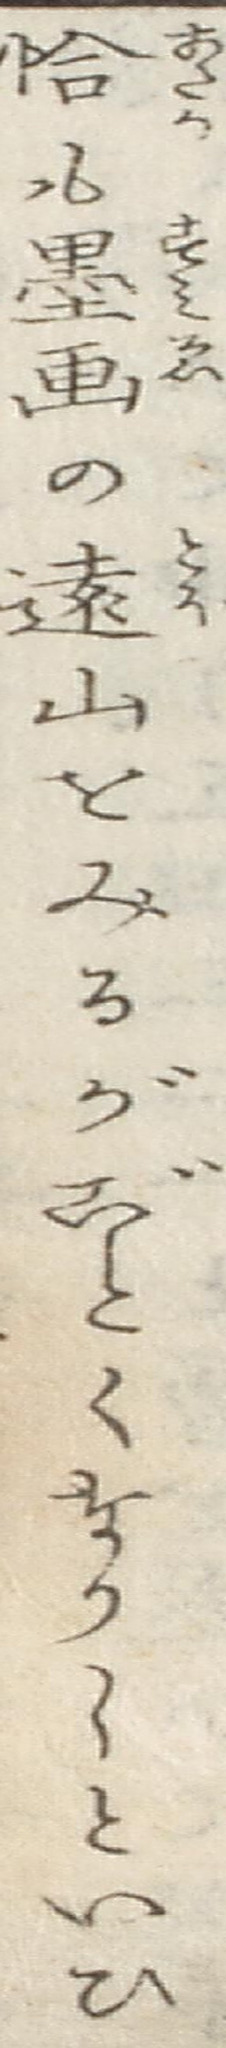恰も墨画の遠山をみるがごとくなりしといひ、
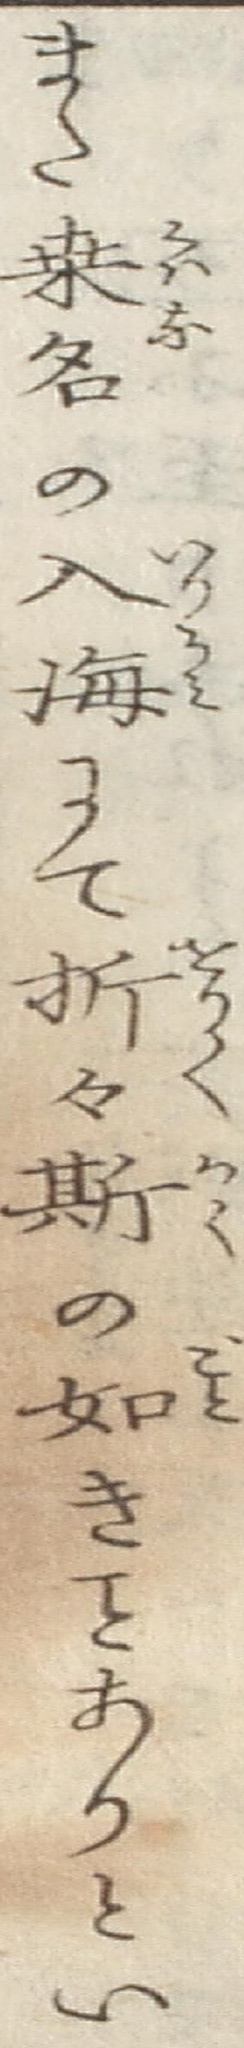また桑名の入海にて折々斯の如きことありとい
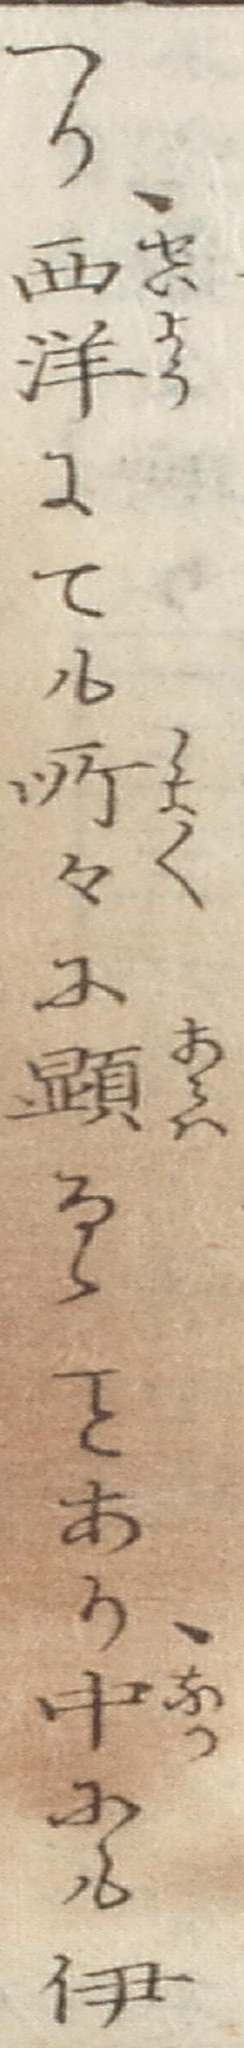へり、西洋にても所々に顕るゝことあり、中にも伊
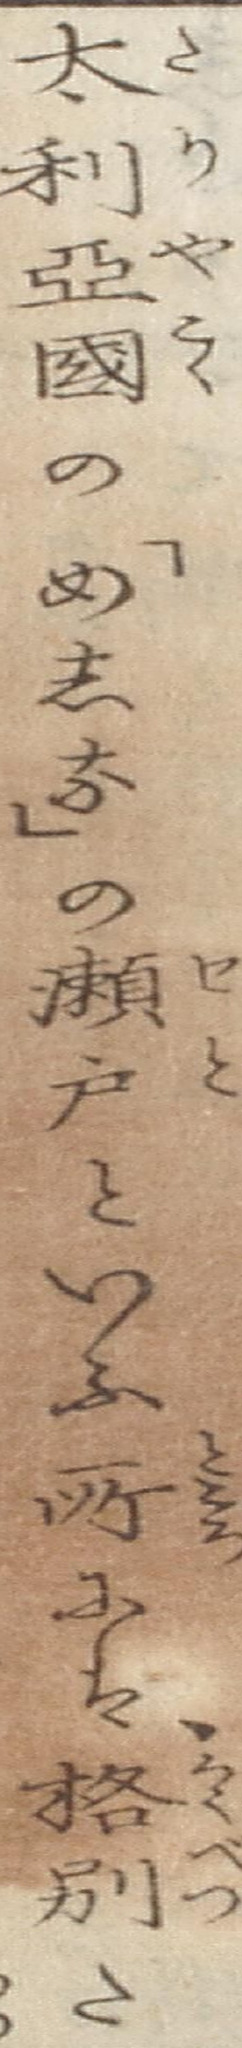太利亜国の「めしな」の瀬戸といふ所には、格別た
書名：変異辯　一名、天變地異拾遺　全
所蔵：東京大学地震研究所図書室 Earthquake Research Institute Library, The University of Tokyo, JAPAN
